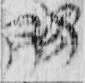賜
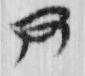君
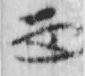正
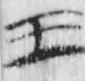王
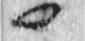厶（私）
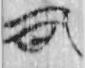司
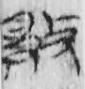敗
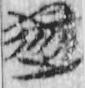逿
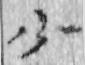少
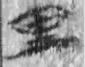里
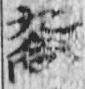喬
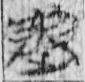與
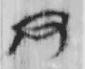尹
